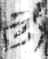戌
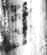坐
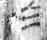於
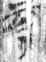亥
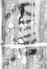盍（蓋）
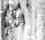於
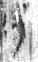子
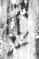城（成）
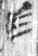於
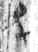丑
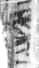○（復）
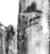於
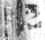寅
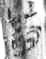○（怨）
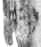於
